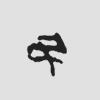民
